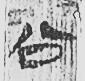公
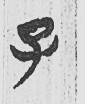子
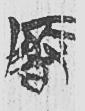啟
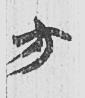方
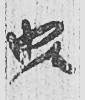𡚦
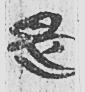是
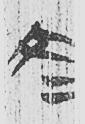文=
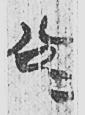公=
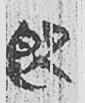即
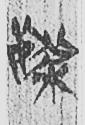殜
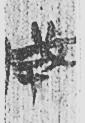成
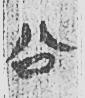公
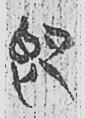即
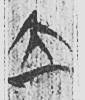立
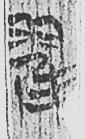翟
